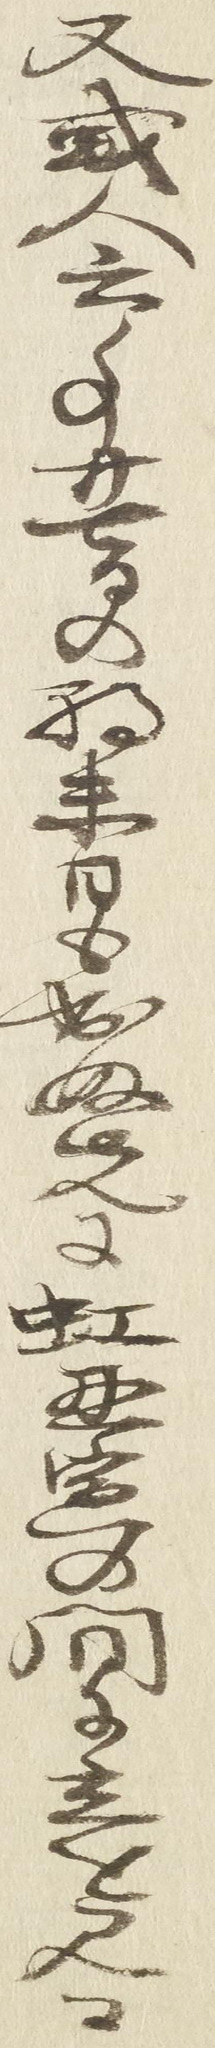又或人六月廿七日の朝未日も出ぬ先に虹丑寅の間に立を見る
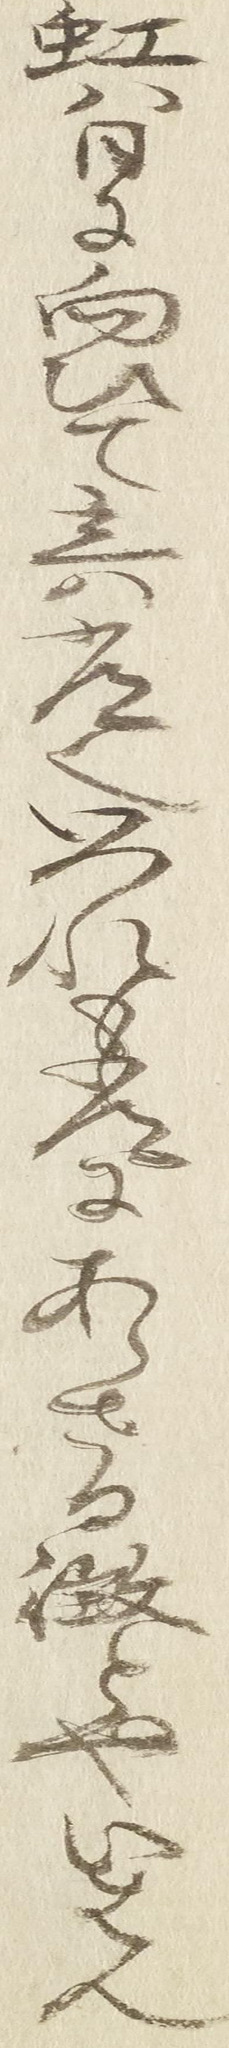虹は日に向ひて立は常也いつれも常にあらざる徴とやいはん
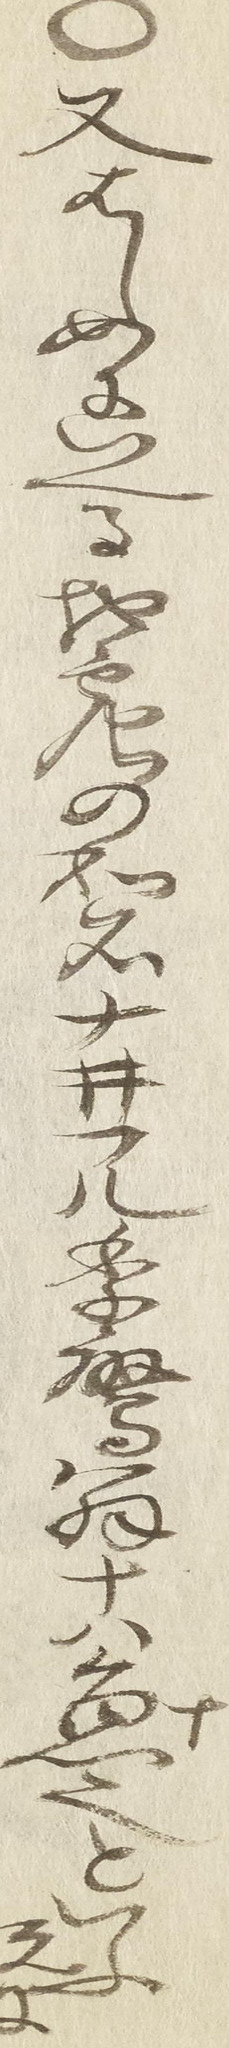○又はしめにいへる地震の和名な井ふる季鷹翁大人魚也といふ説に
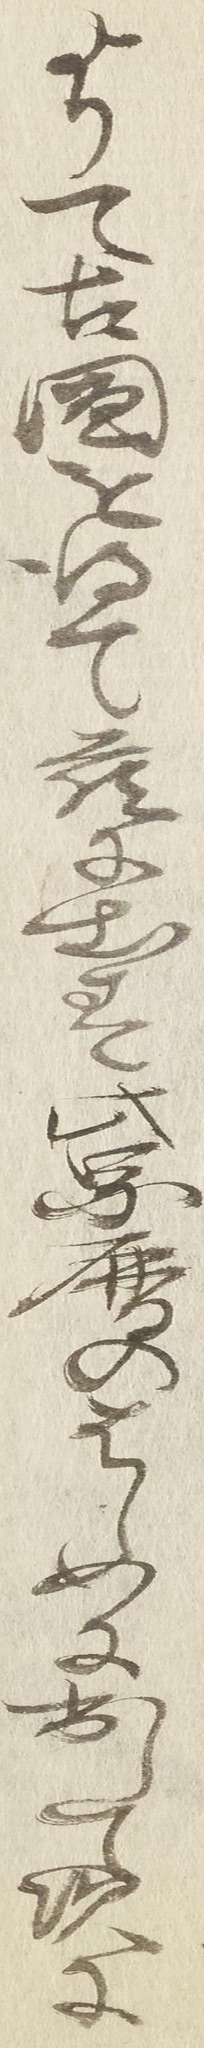よりて古圖を得て茲に出す是圖暦のはしめに出して次に
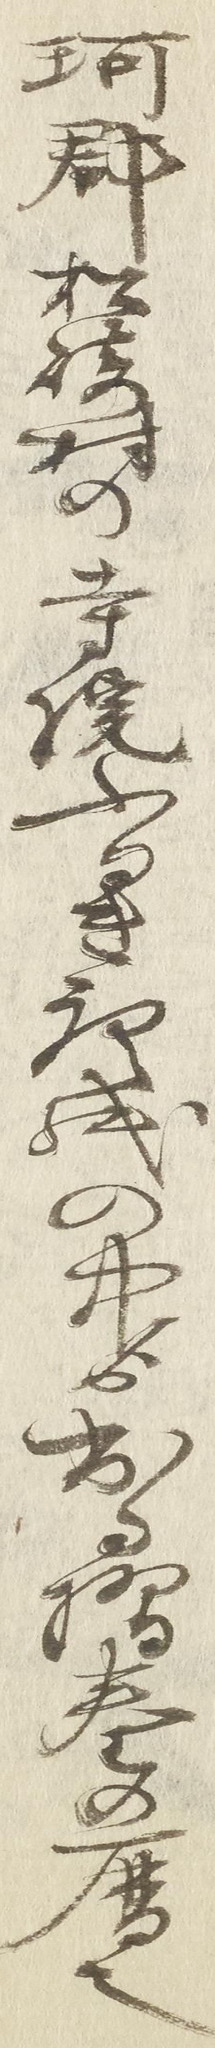珂郡松崎村の寺院ふるき唐紙の中より出る摺巻の暦也

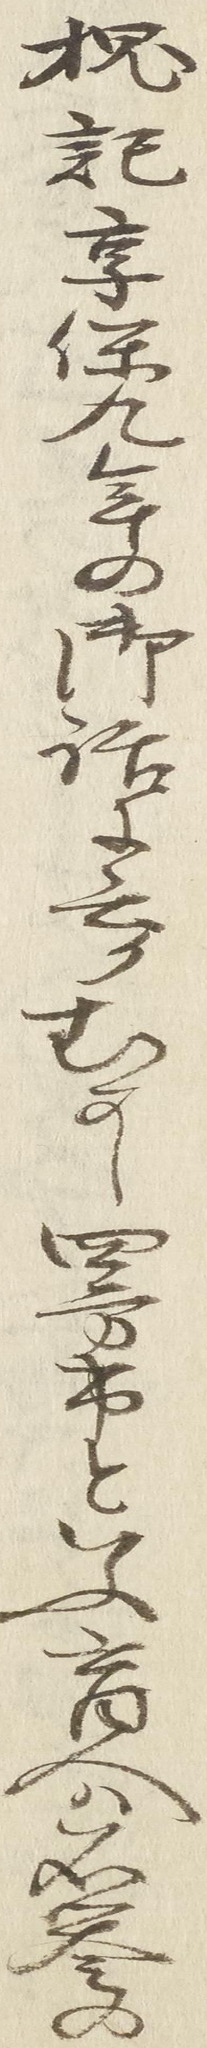塊記享保九年の御話に云くむかし四方市といふ盲人は名誉
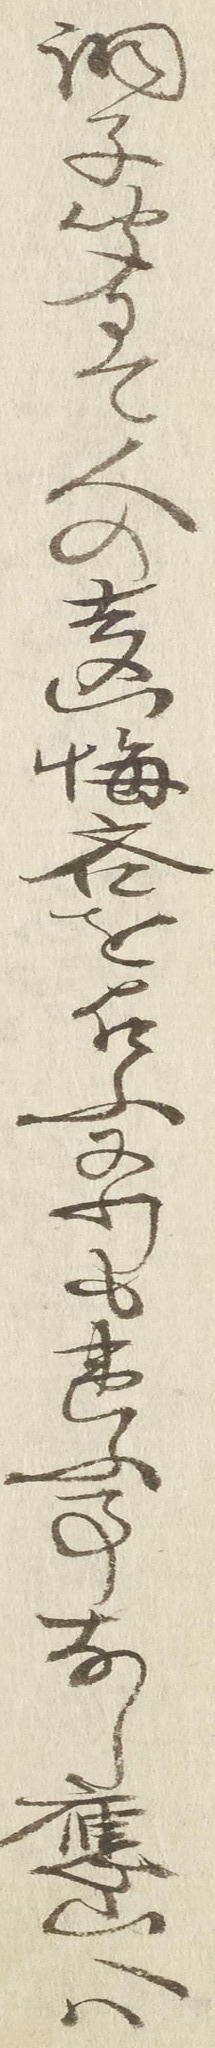の調子聞にて人の吉凶悔吝を占ふに少しも違ふことなし応山へは
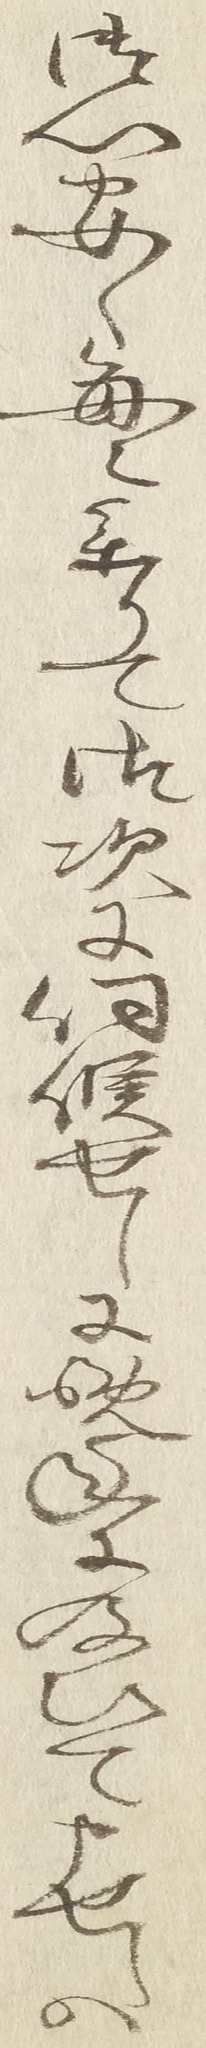御心安く毎々参りて御次に伺候せしに晩年に及ひて申せしは
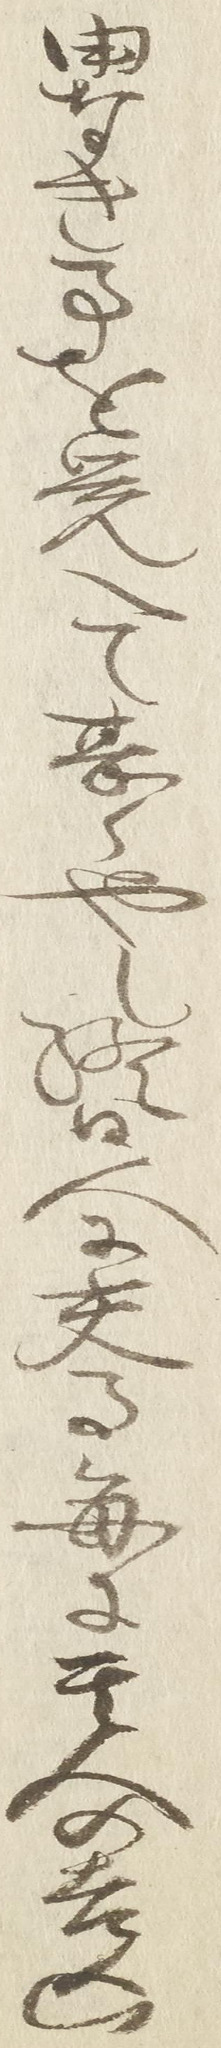由なきこと覚えて甚くやし終日人に交はる毎に其人の吉凶
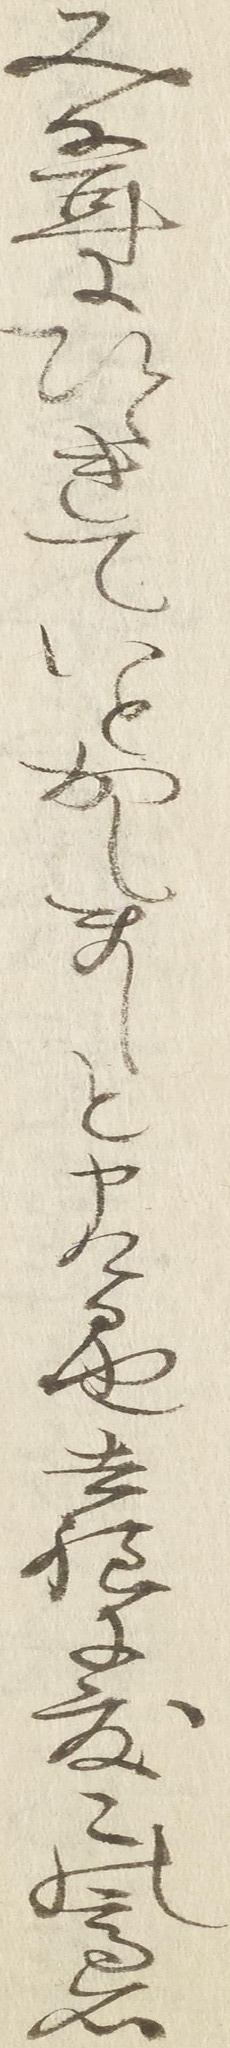みな耳にひゞきていとかしましと申ける由去ほどに度々の高名
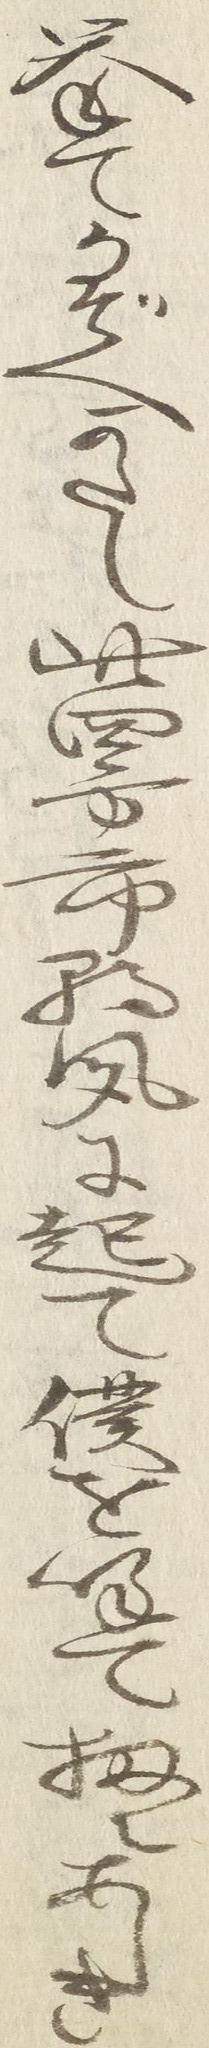挙てかぞへかたし此四方市朝夙に起て僕を呼ひ扨々あしき
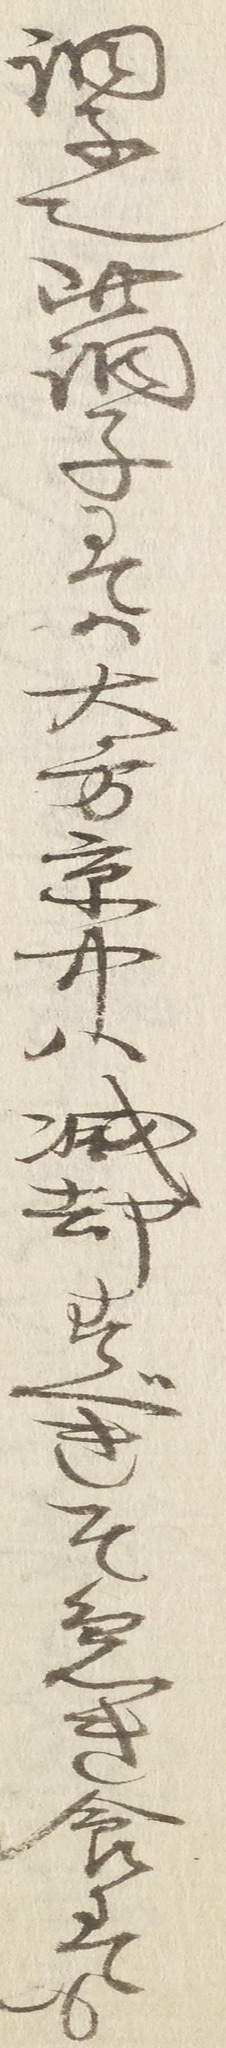調子なり此調子にては大方京中は滅却すべきぞ急ぎ命にても
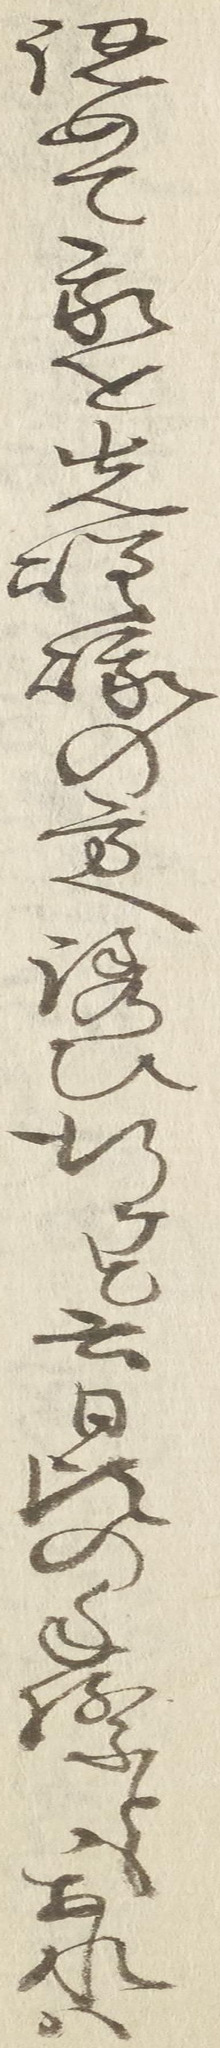認めて我を先嵯峨の方へ誘ひ行けと云日頃の手際どもあれは
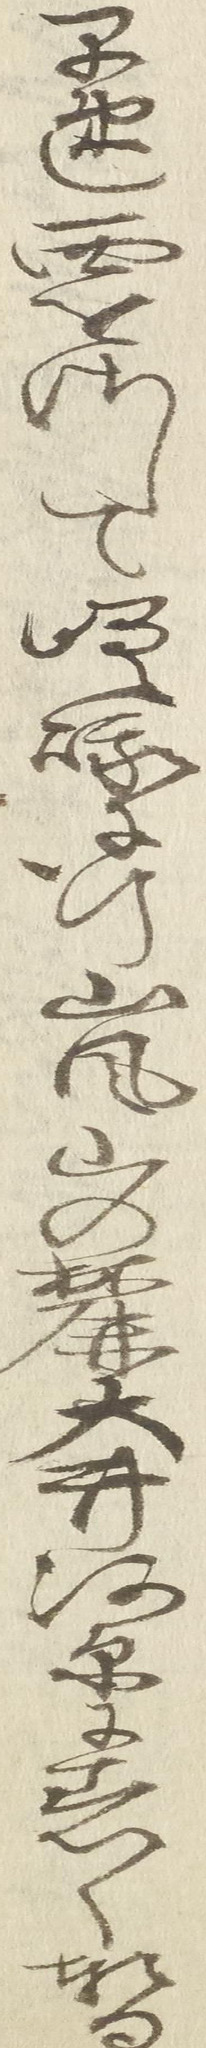早速西をさして嵯峨に行嵐山の麓大井河原に着て暫
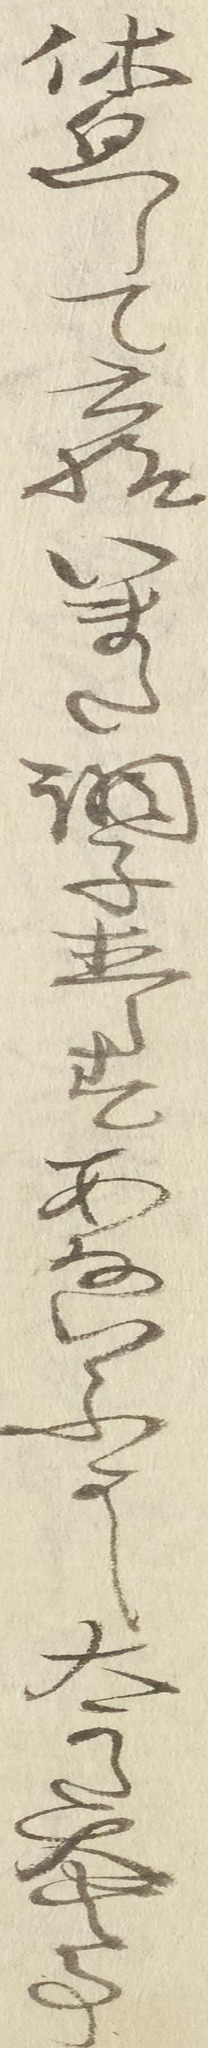く休息して云様いまだ調子直らずあないふかし大かた大火事

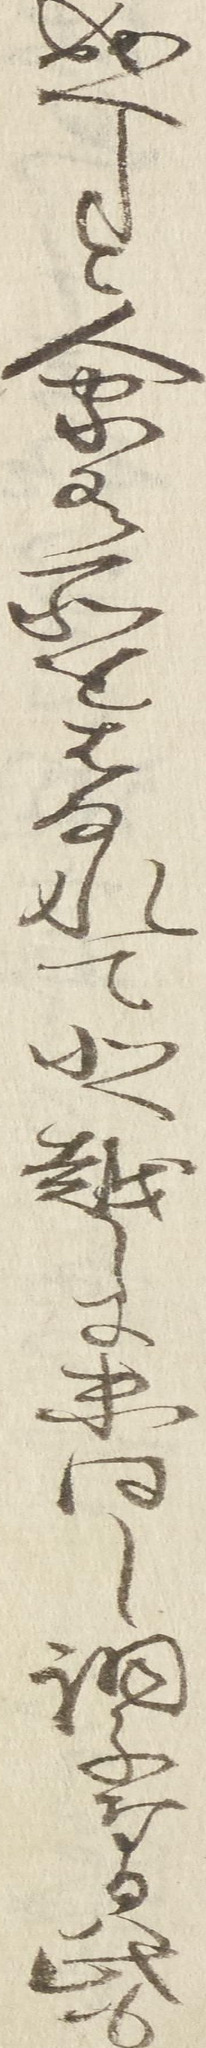成べしと人家有所をはなれて北へ越しに未同し調子なるは此も
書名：地震記　下
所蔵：東京大学地震研究所図書室 Earthquake Research Institute Library, The University of Tokyo, JAPAN
